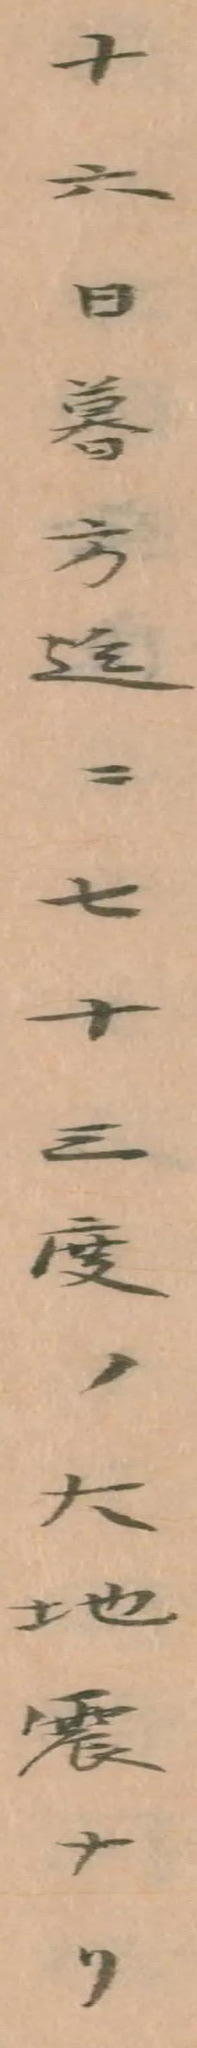十六日暮方迄ニ七十三度ノ大地震ナリ
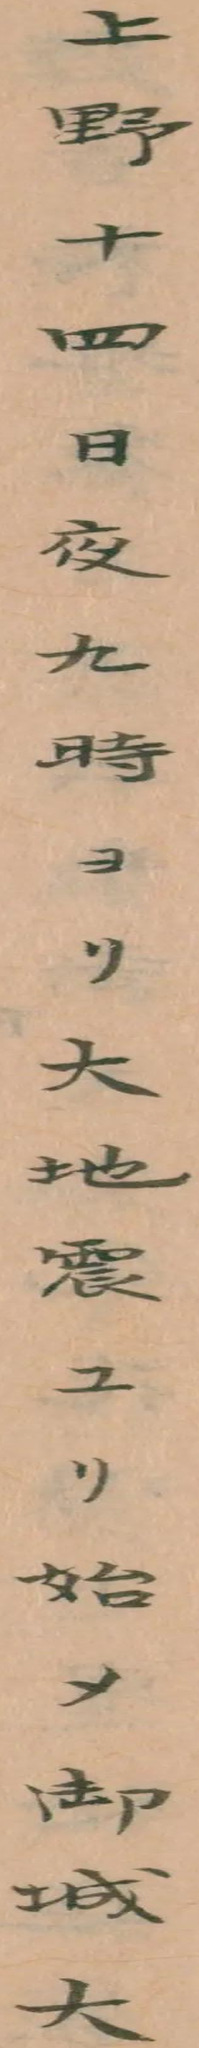上野十四日夜九時大地震ユリ始メおん御城大
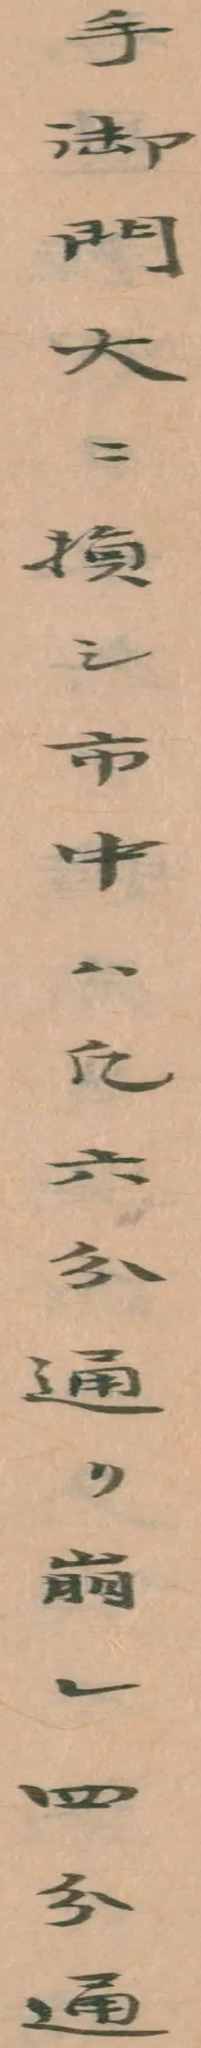手御門大ニ損シ市中ハ凡六分通り崩レ四分通
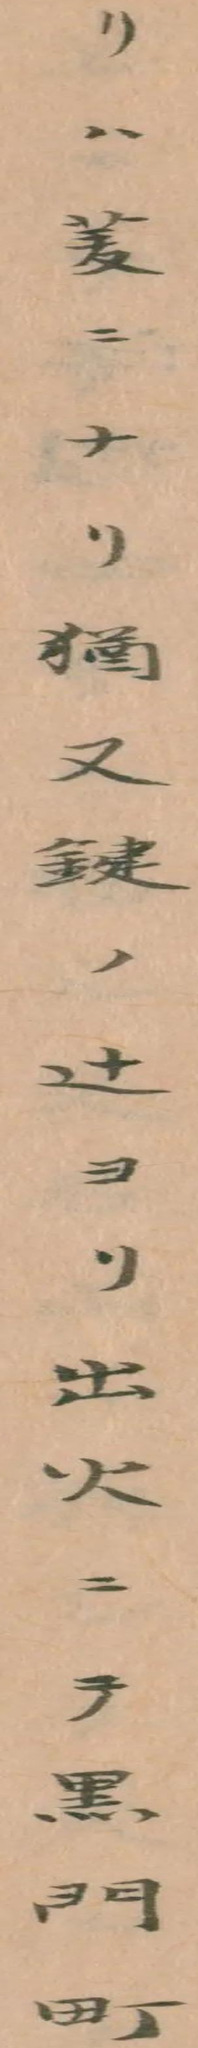りハ菱ニナリ猶又鍵ノ辻ヨリ出火ニテ黒門町
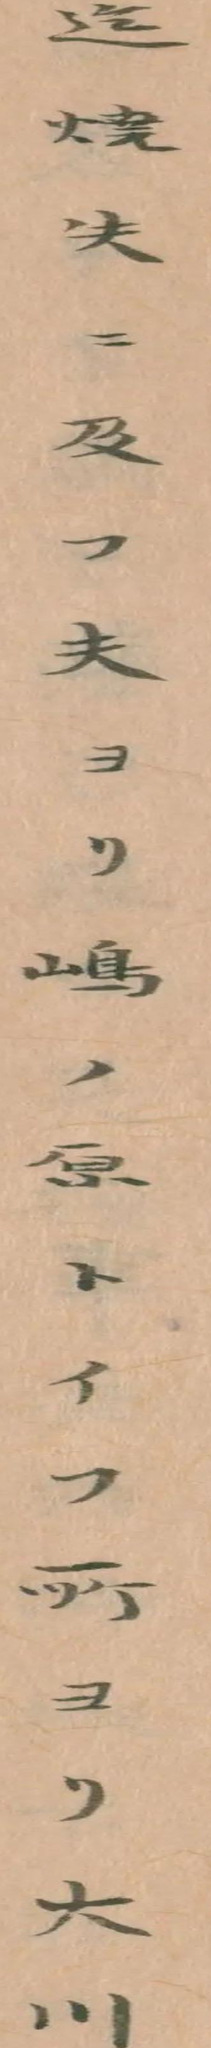迄焼失ニ及フ夫ヨリ嶋ノ原トイフ所ヨリ大川
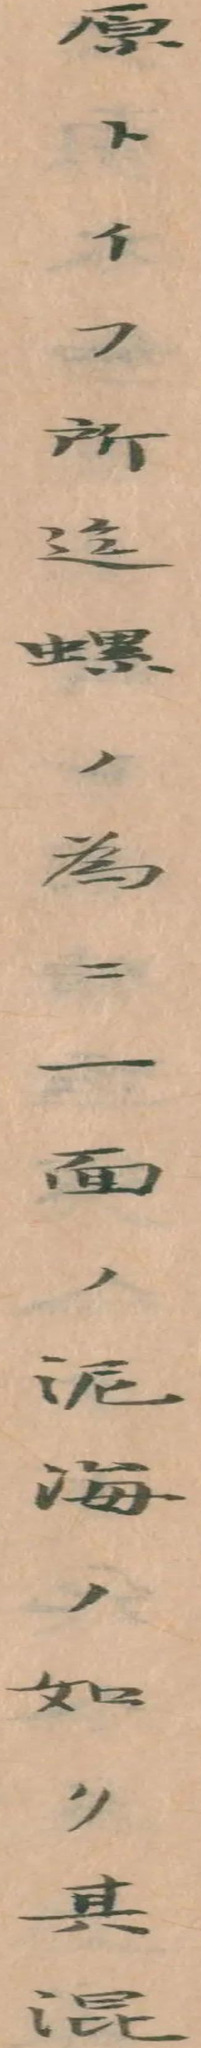原トイフ所迄螺ノ為ニ一面ノ泥海ノ如ク其混
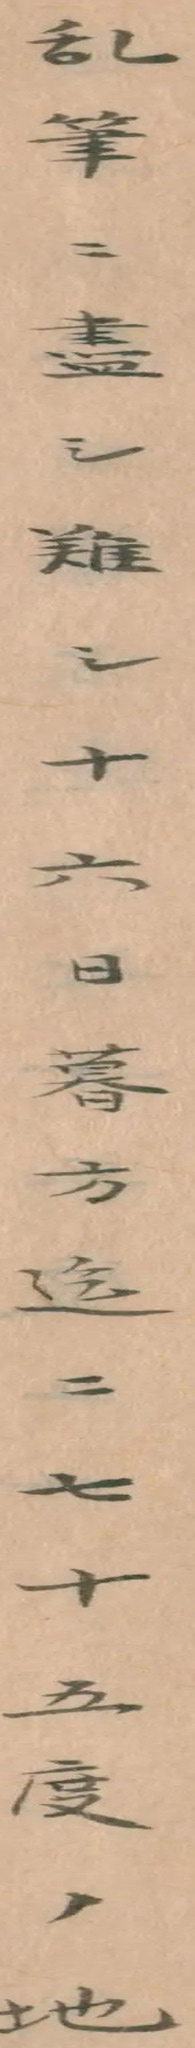乱筆ニ尽シ難シ十六日暮方迄ニ七十五度ノ地
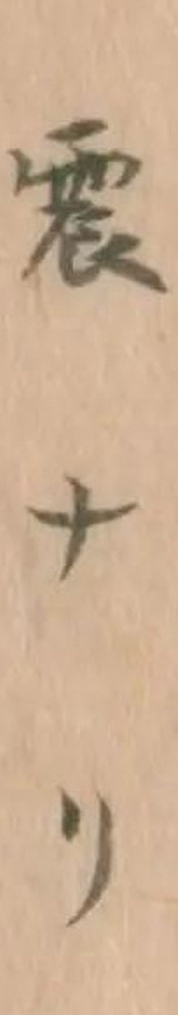震ナリ
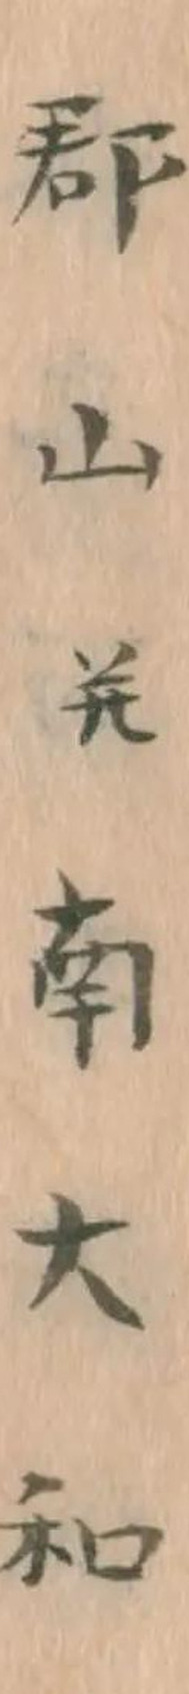郡山并大和
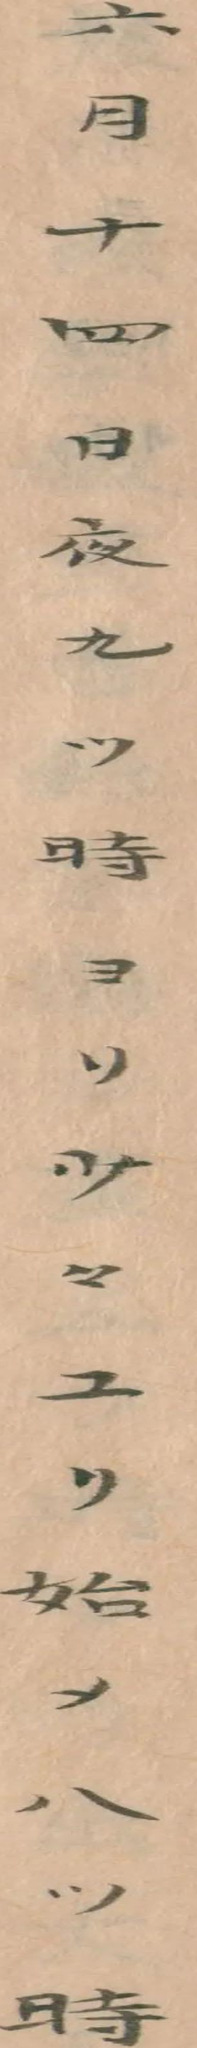六月十四日夜九ッ時ヨリ少々ユリ始メ八ッ時
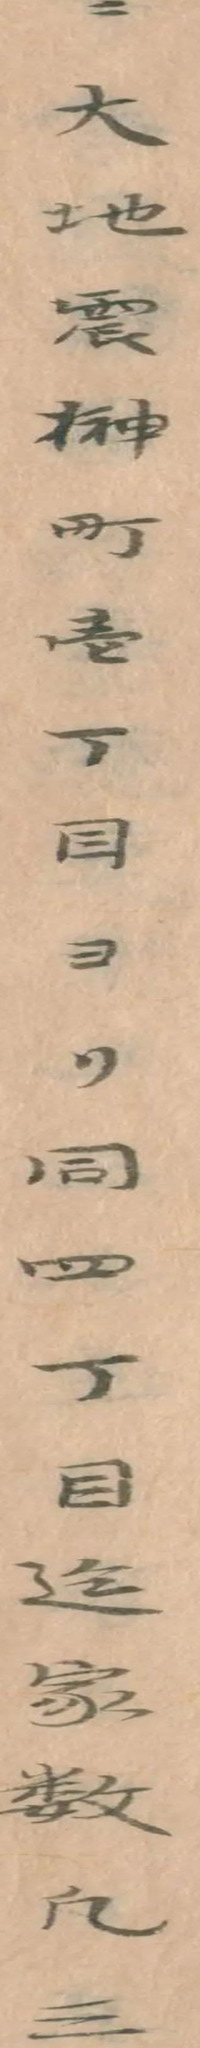二大地震榊町壱丁目より同四丁目迄家数凡三

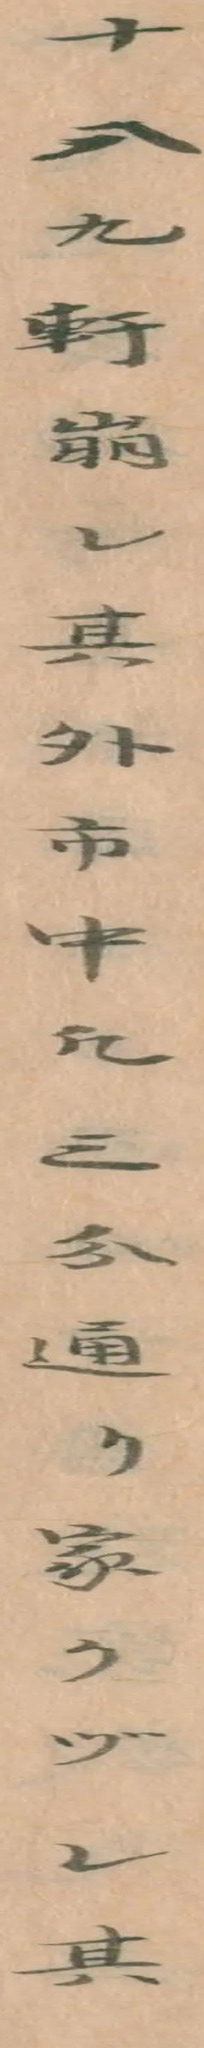十八九軒崩レ其外市中凡三分通り家クヅレ其
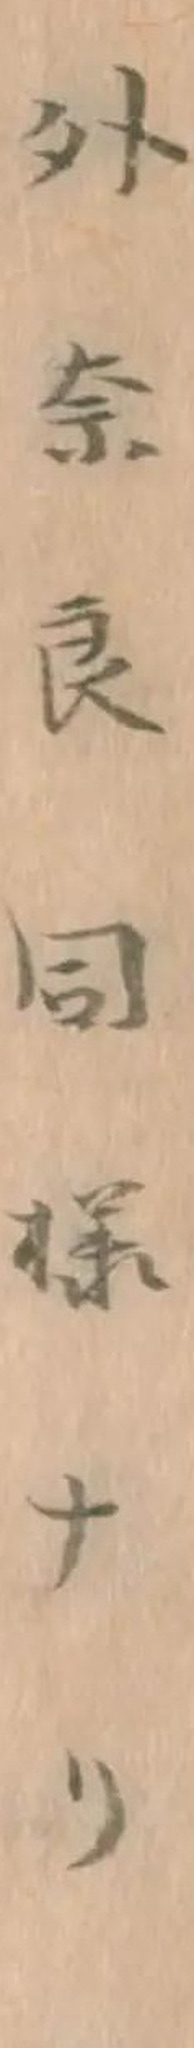外奈良同様ナリ
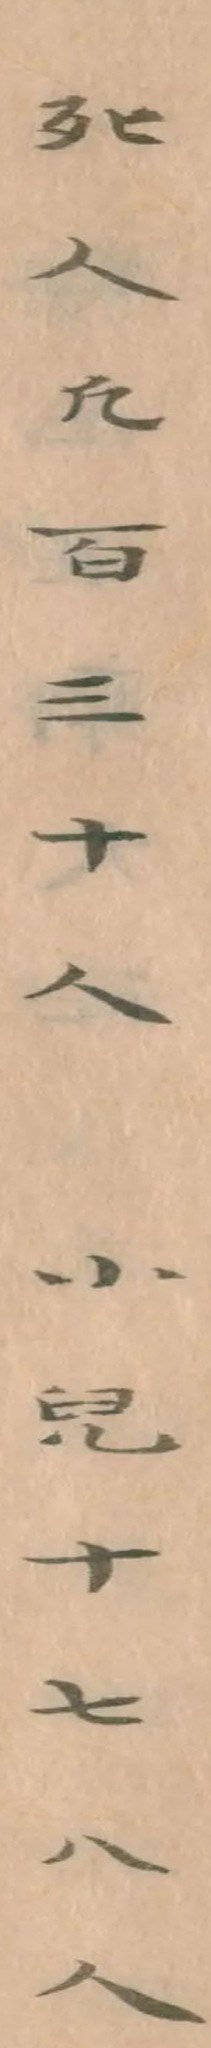死人凡百三十人小児十七八人
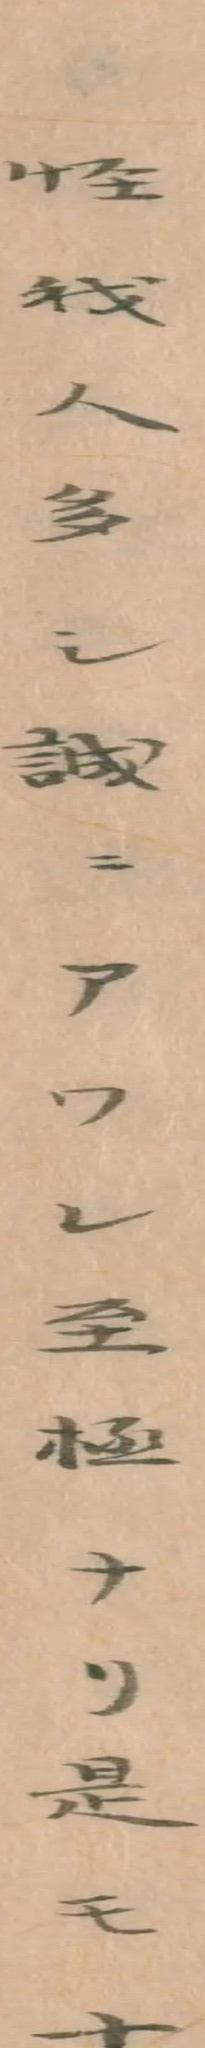怪我人多シ誠二アワレ至極ナリ是モ十
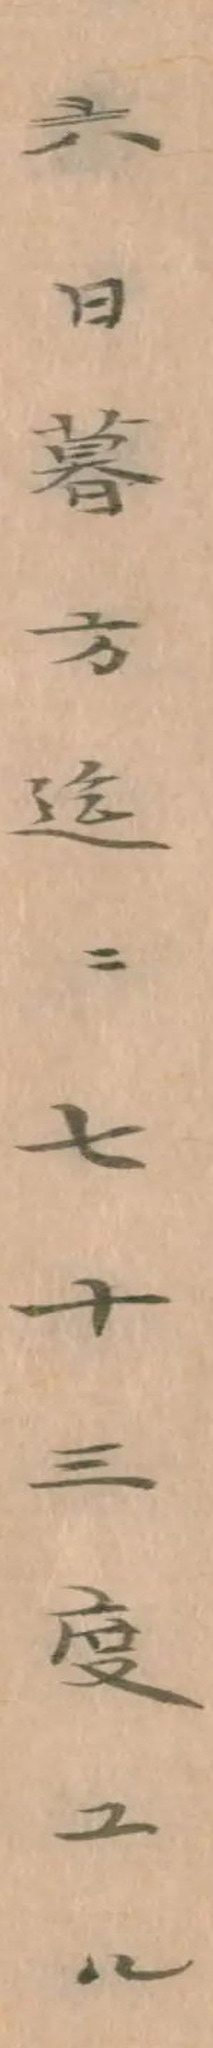六日暮方迄ニ七十三度ユル
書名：地災撮要. 巻1(噴火山・地震ノ部)
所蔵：国立国会図書館 National Diet Library, JAPAN
